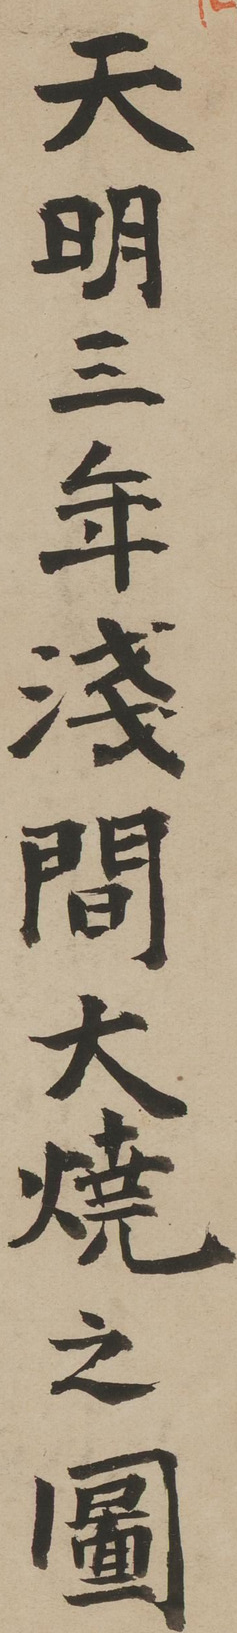天明三年浅間大焼之図
